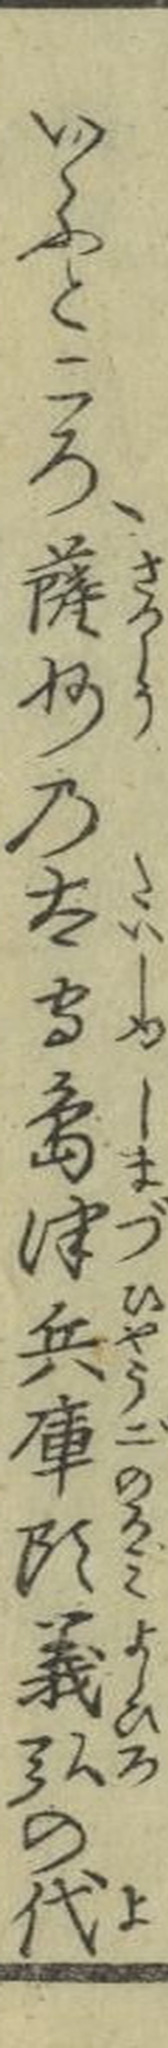いふところ、薩州の太守島津兵庫頭義弘の代
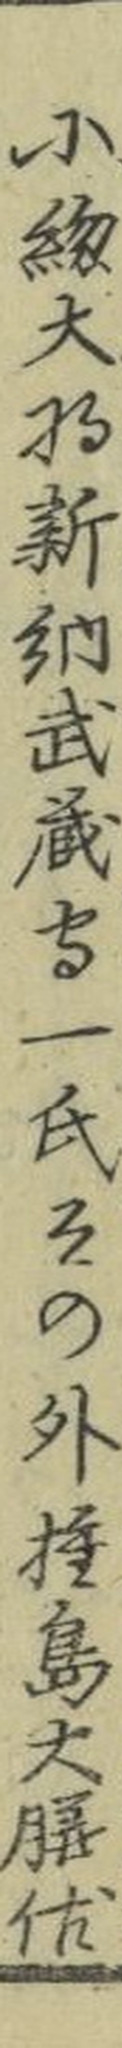に、惣大将新納武蔵守一氏、その外種島大膳、佐
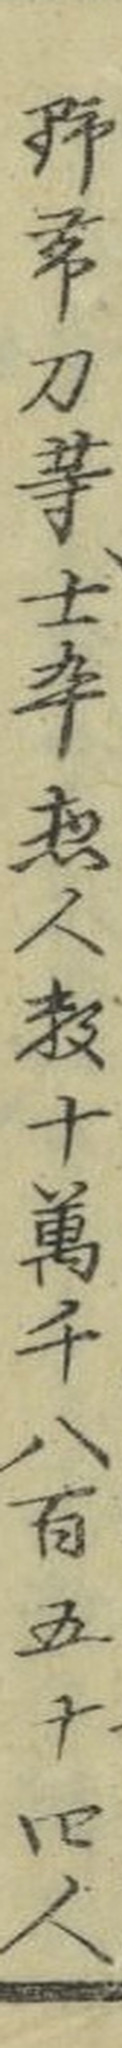野帯刀等、士卒惣人数十万千八百五十四人
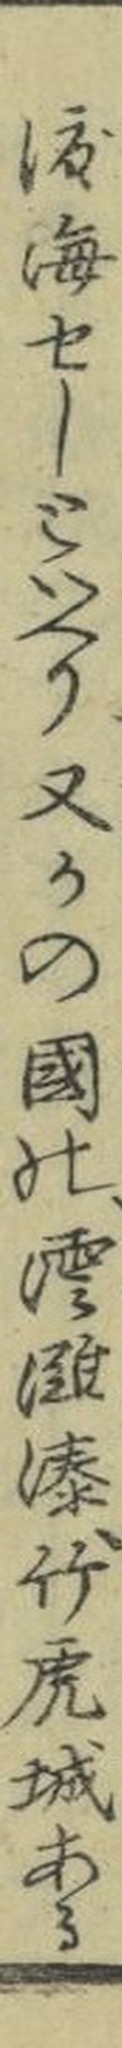渡海せしといへり、又かの国の、澐灘湊、竹虎城ある
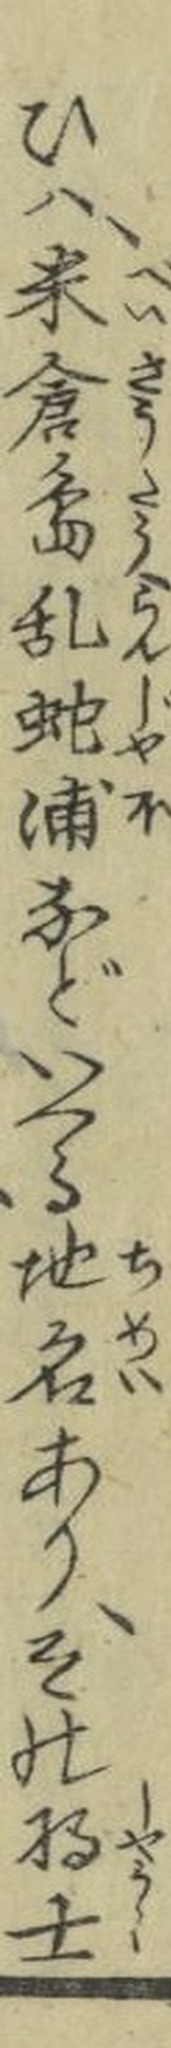ひは、米倉島、乱蛇浦などいへる地名あり、その将士
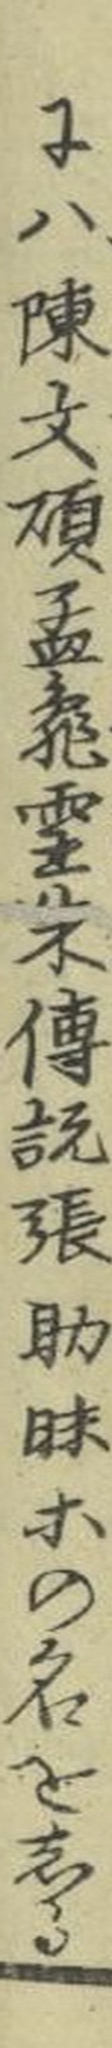には、陳文碩、孟亀霊、朱伝説、張助昧等の名をしる
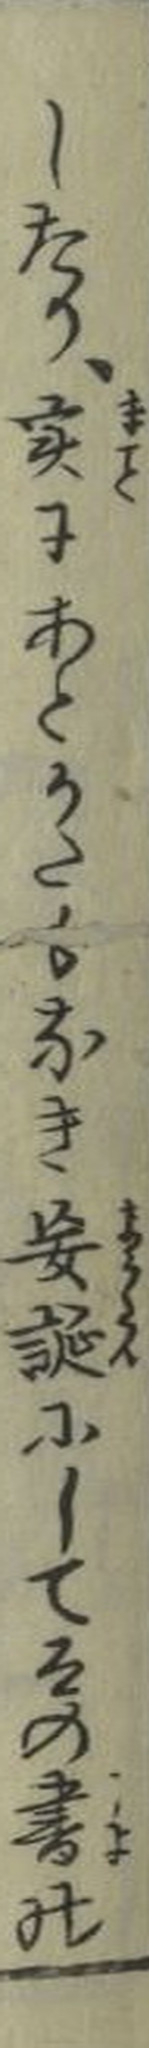したり、実にあとかたもなき妄誕にしてその書の
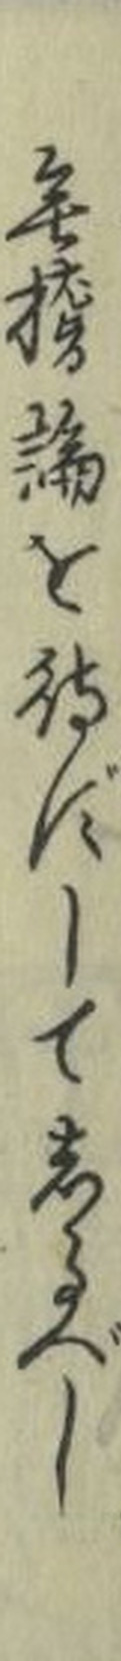無稽論を待ずしてしるべし、
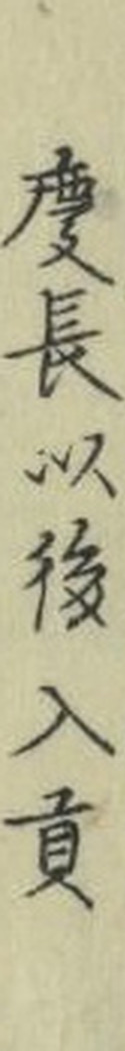慶長以後入貢
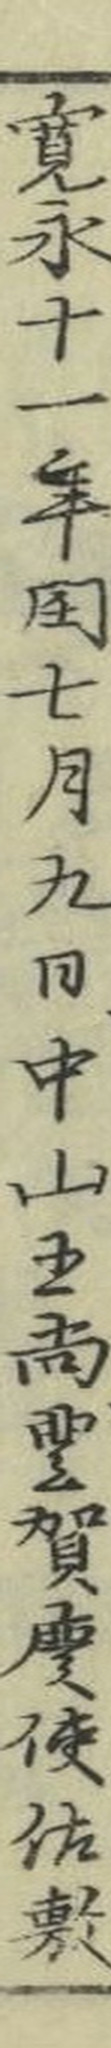寛永十一年閏七月九日、中山王尚、豊賀慶使佐敷
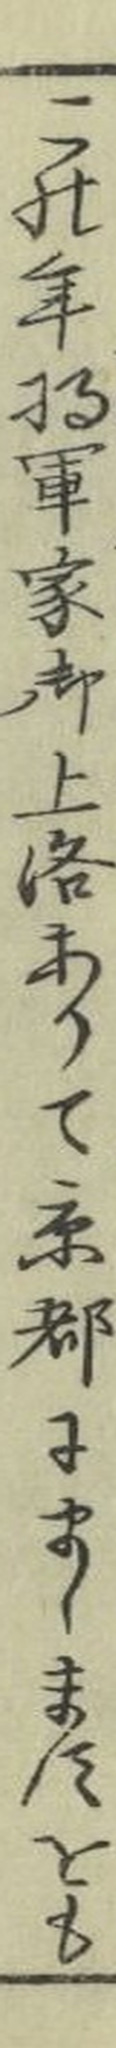この年将軍家御上洛ありて、京都にましますをも
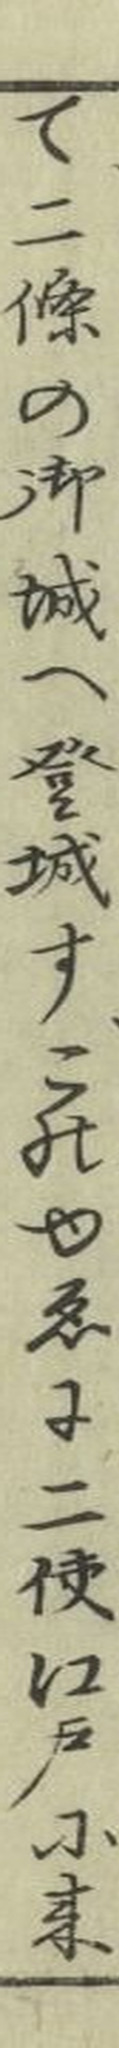て、二条の御城へ登城す、このゆゑに二使江戸に来
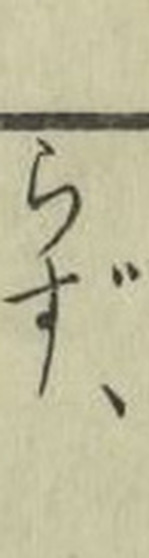らず、
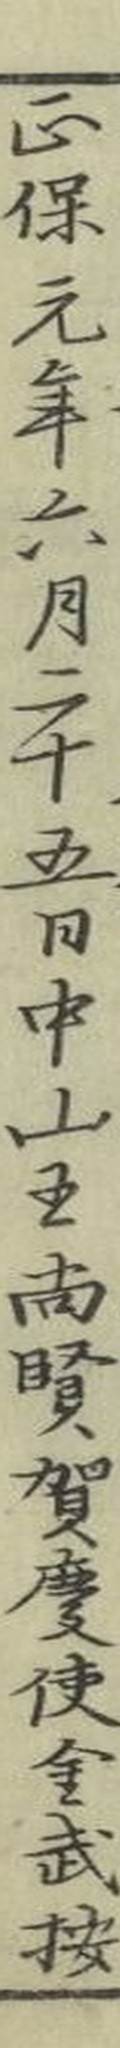正保元年六月二十五日、中山王尚賢、賀慶使金武按

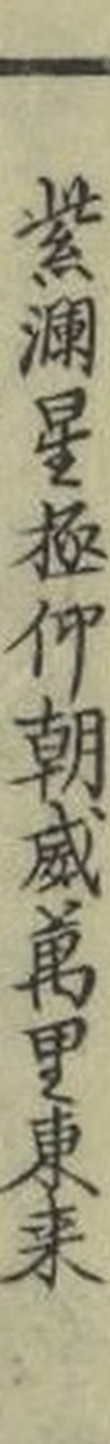紫瀾星極仲朝威万里東来
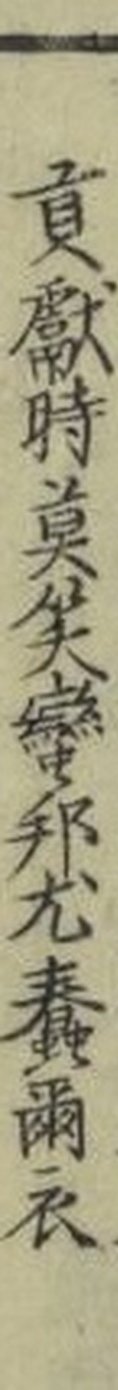貢献時莫笑蛮邦尤蠢爾衣
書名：琉球入貢紀略
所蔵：University of the Ryukyus Library
